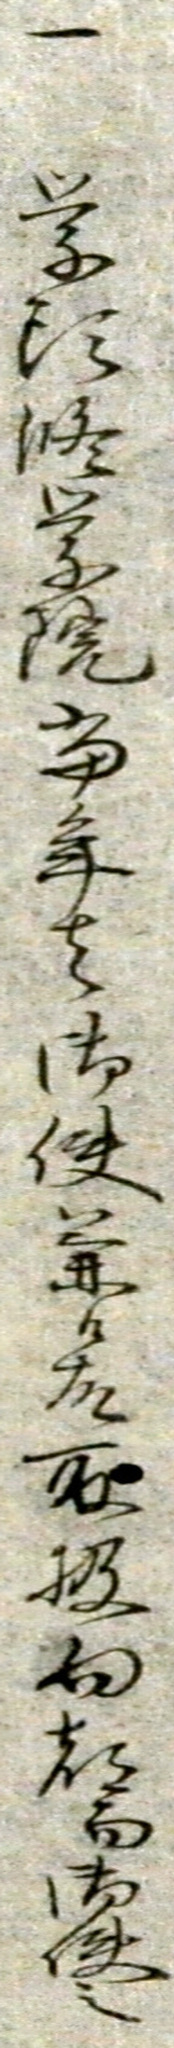一学頭修学院当年は御使兼候故取扱向都而御使之
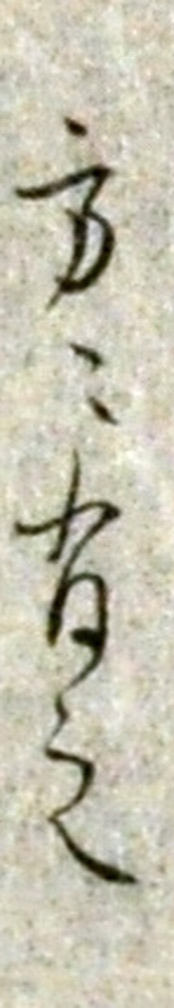方ニ有之
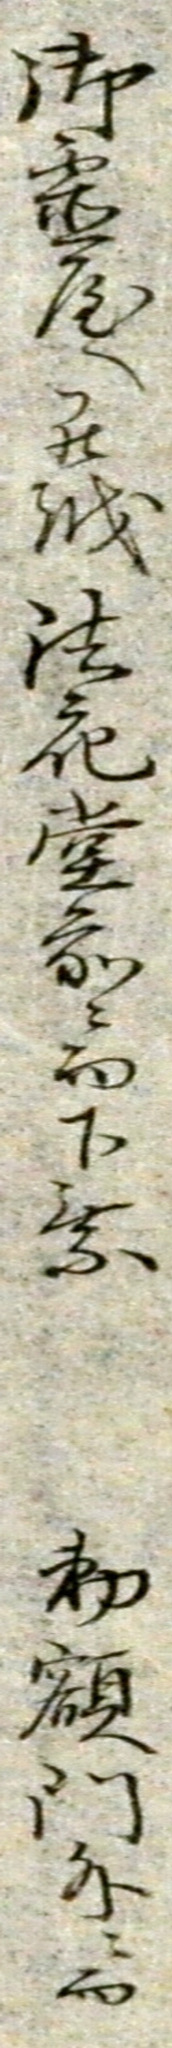御霊屋へ罷越法花堂前ニ而下乗勅額門外ニ而
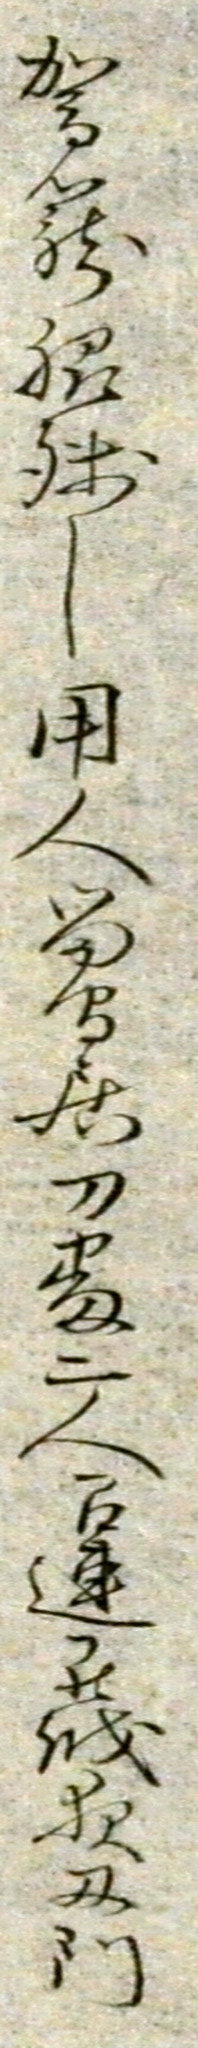駕籠脇残し用人留守居刀番二人召連罷越夜刃門
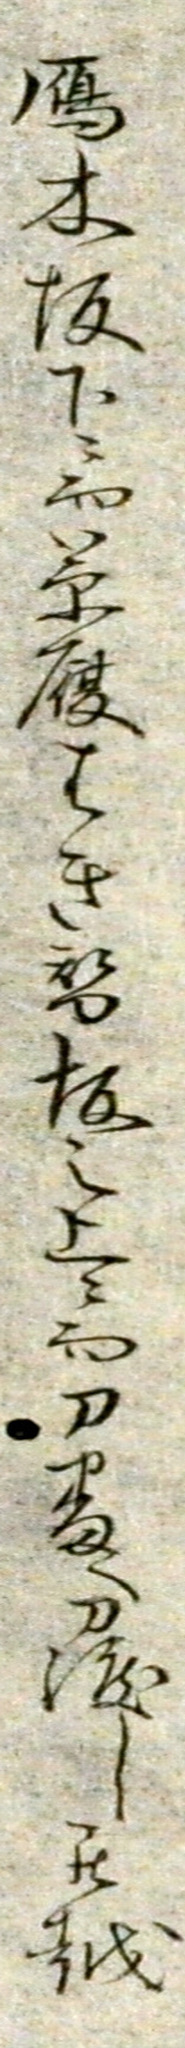雁木坂下ニ而草履はき替坂之上ニ而刀番へ刀渡し罷越
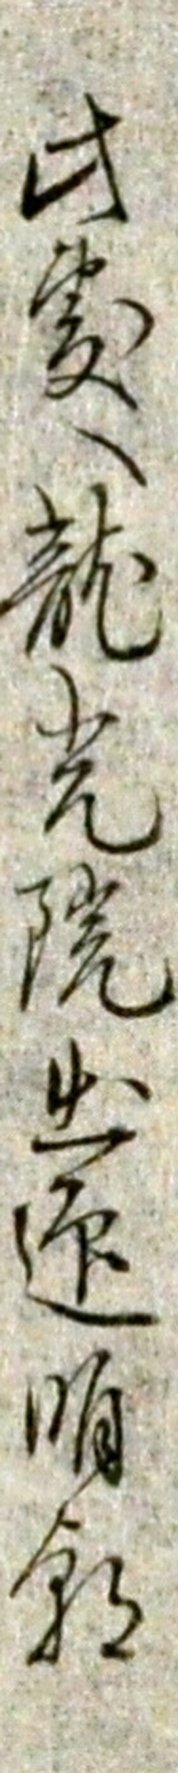此処へ龍光院出迎明朝
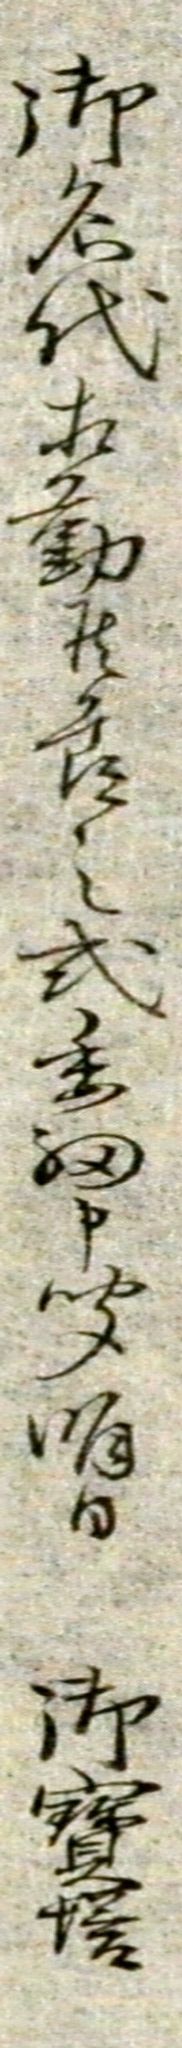御名代相勤候節之式委細申聞明日御宝塔
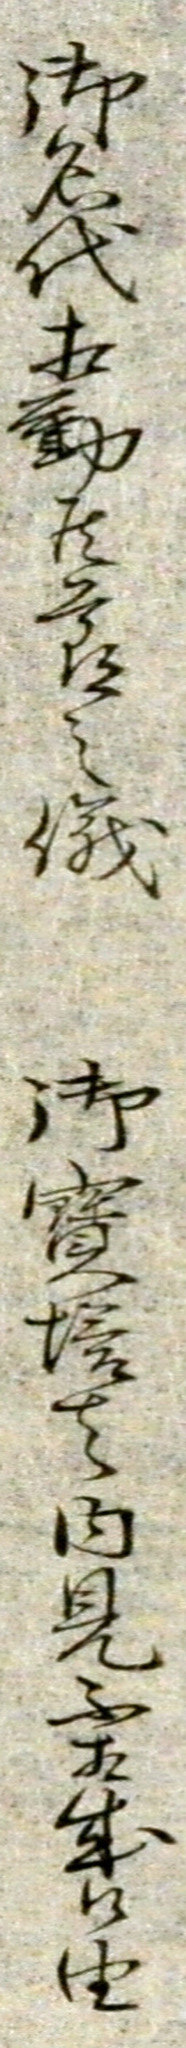御名代相勤候節之儀御寶塔は内見不相成候由
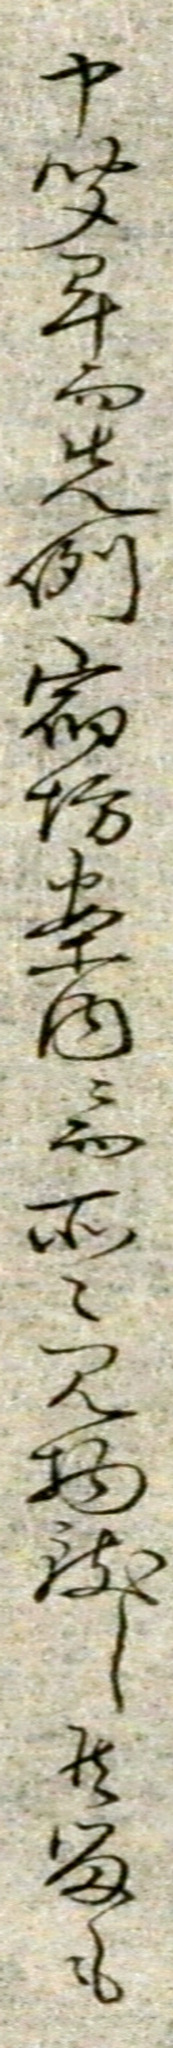申聞畢而先例宿坊案内二而所々見物致し候留も
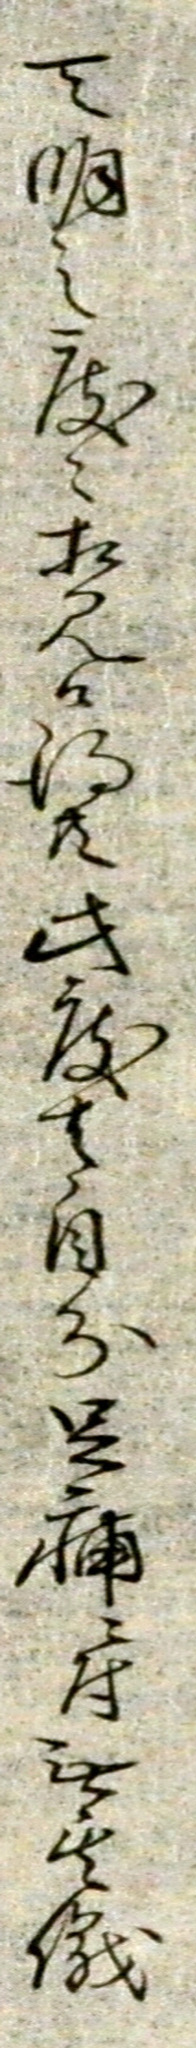天明之度々相見候得共此度は自分足痛ニ付無其儀
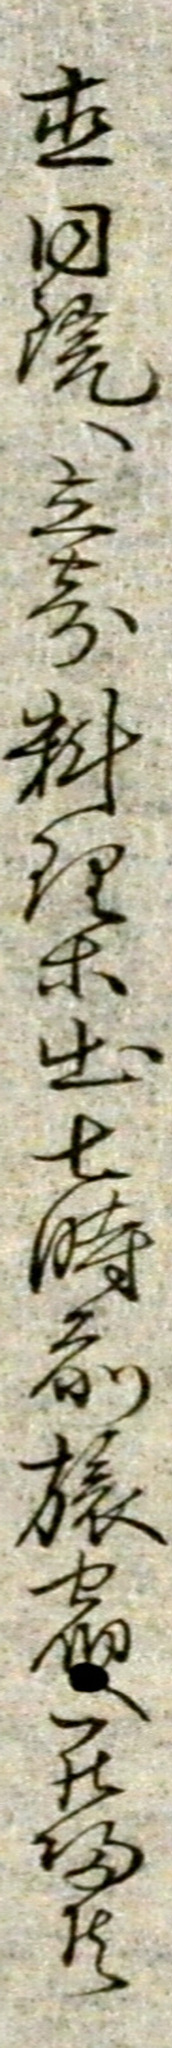直同院へ立寄料理等出七時前旅宿へ罷帰候
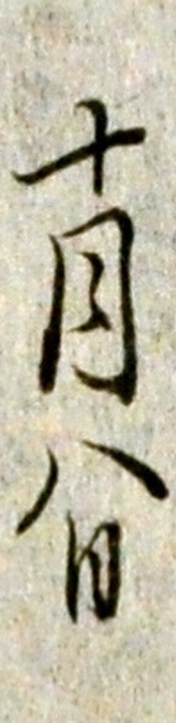十月八日
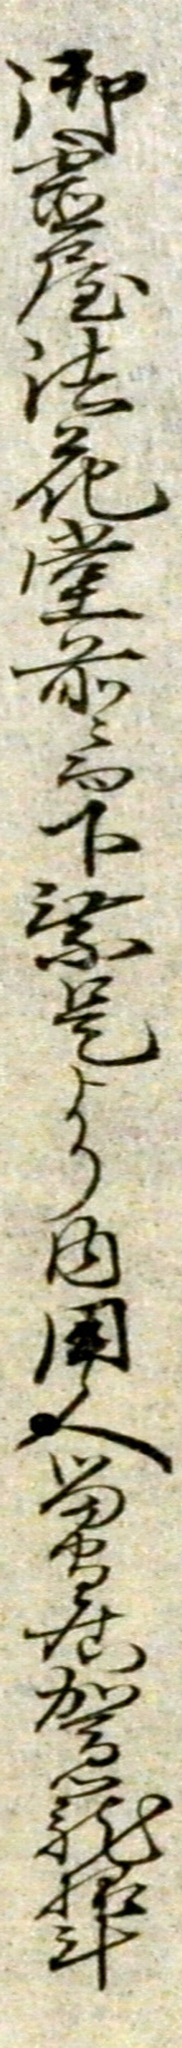御霊屋法花堂前ニ而下乗是より内用人留守居駕籠脇斗
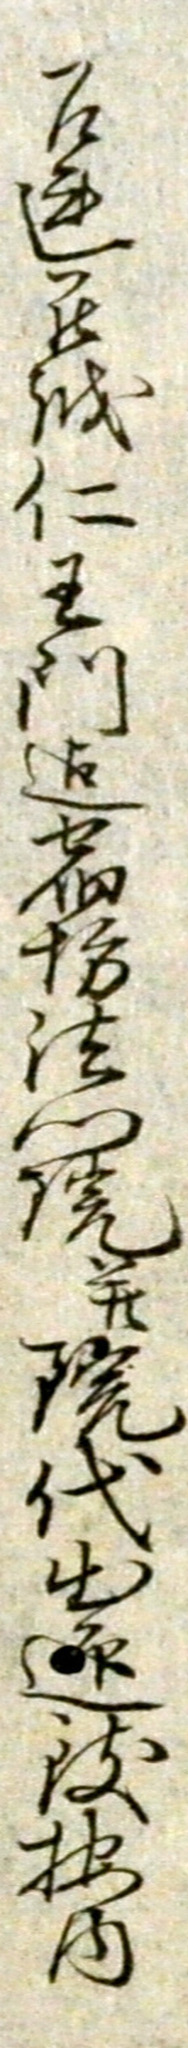召連罷越仁王門迄宿坊法門院幷院代出迎致按内
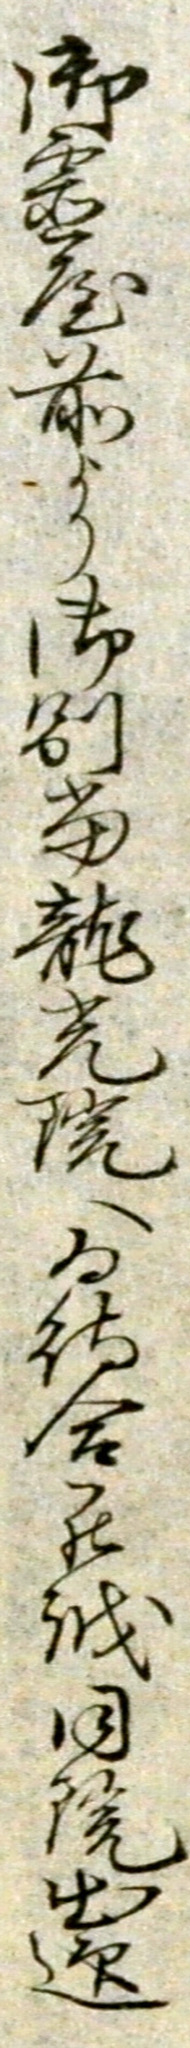御霊屋前より御別当龍光院へ為待合罷越同院出迎
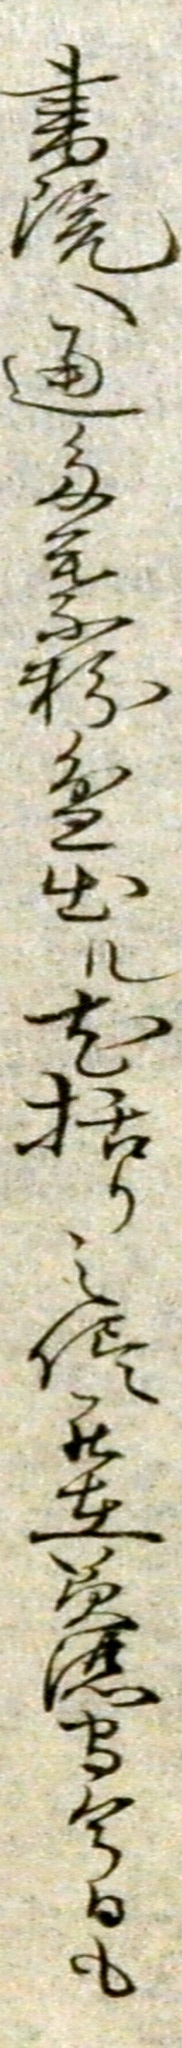書院へ通多葉粉盆出ル尤括り之儘罷在美濃守今日も
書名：日光御名代相勤候節ノ留
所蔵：伊那市立高遠町図書館・合同会社AMANE
